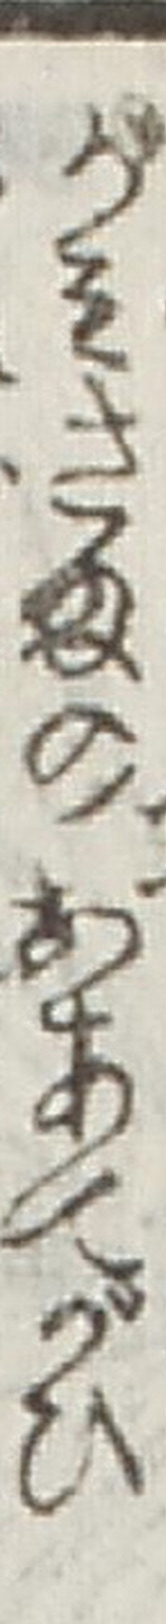かみさまのおあてがひ
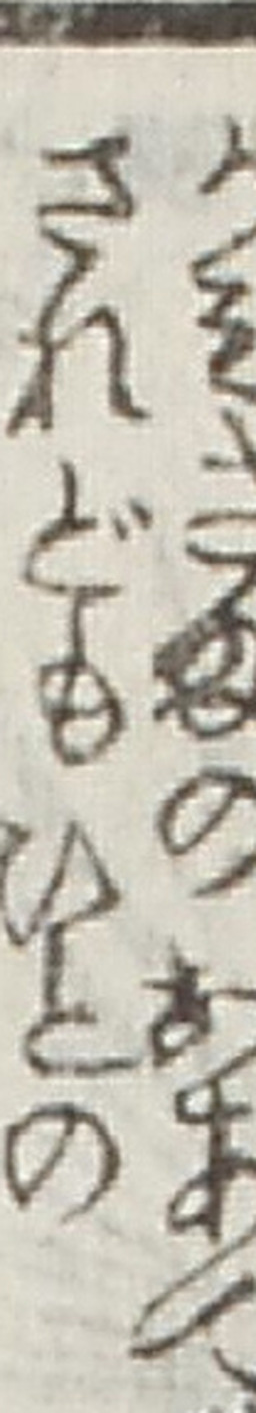されどもひとの
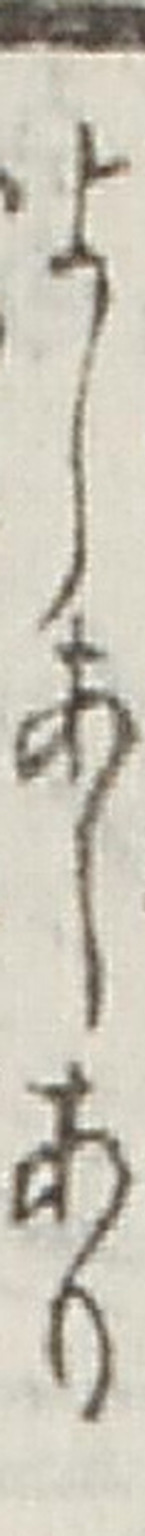よしあしあり
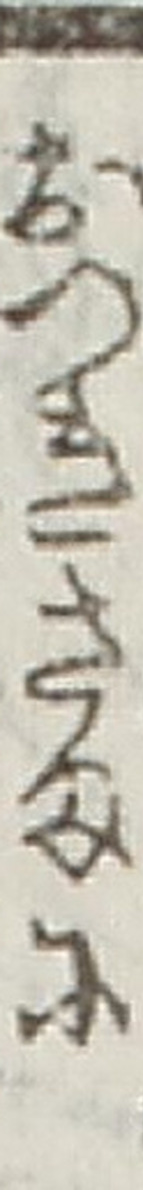おつきさまに
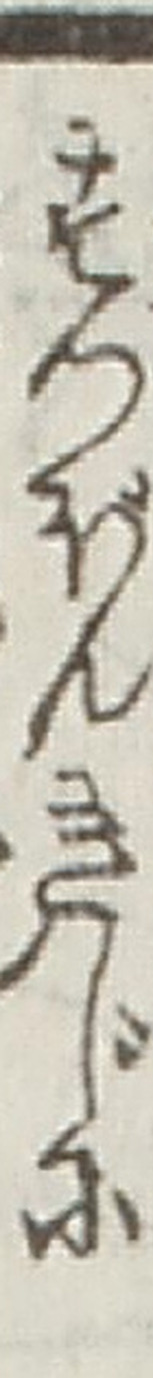すつぽんきじに
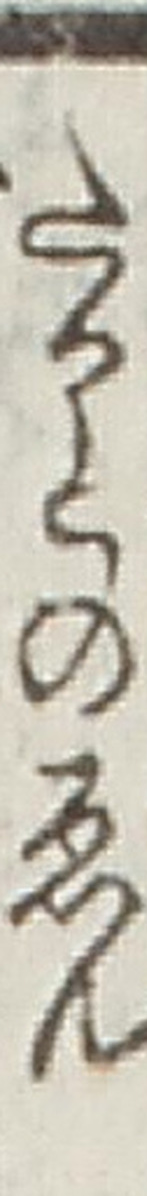たかのとゑん
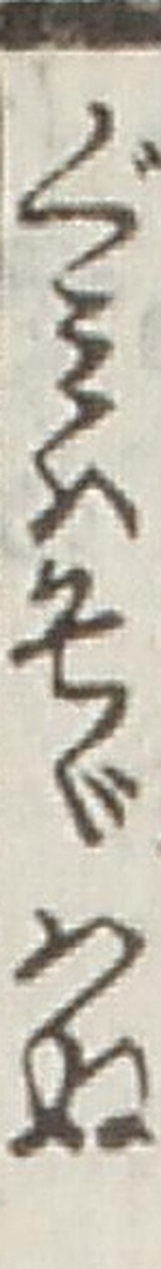ぐみはそぐはぬ
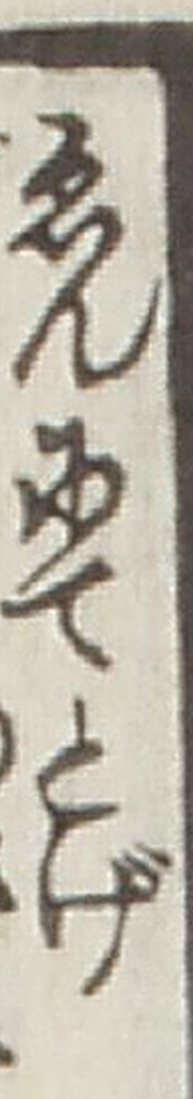ゑんにてとげ
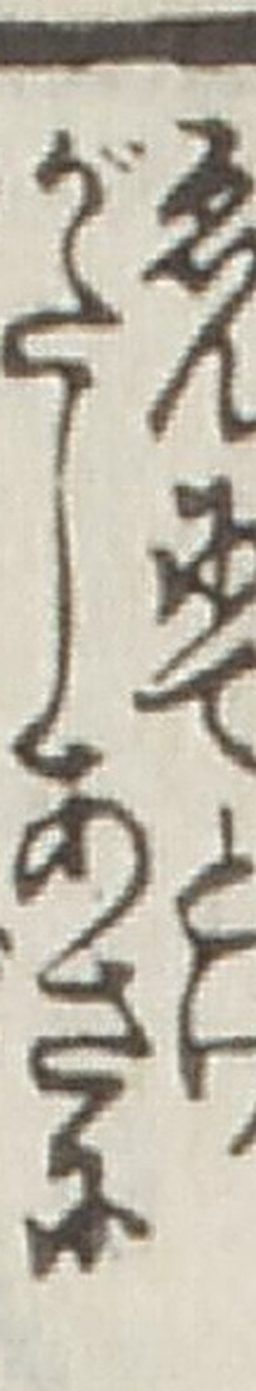がたしあさに
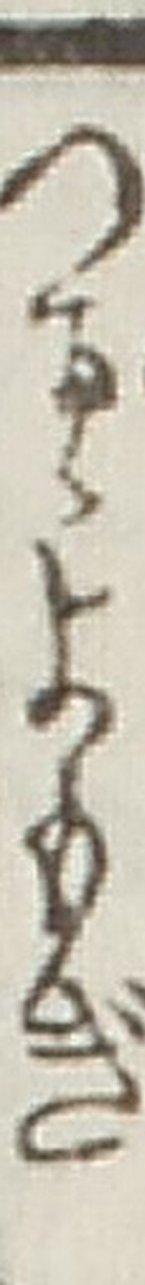つるゝよもぎ
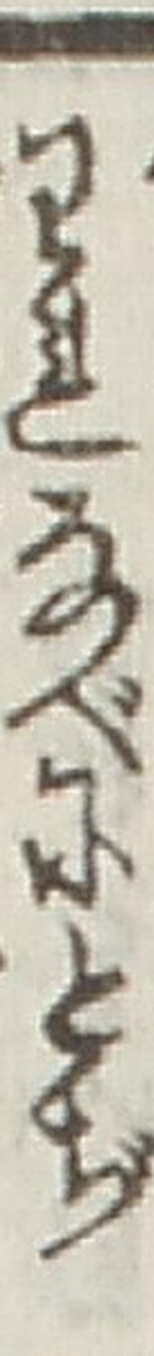われなべとぢ
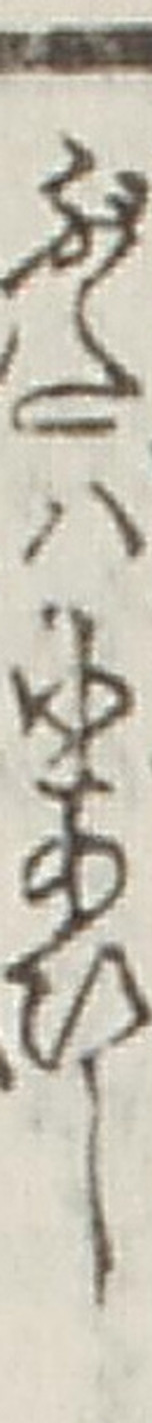ぶたはにあひし
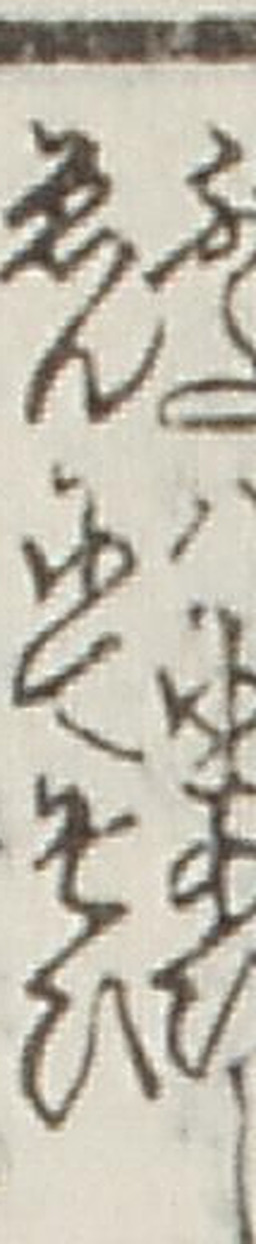ゑんにてそひ
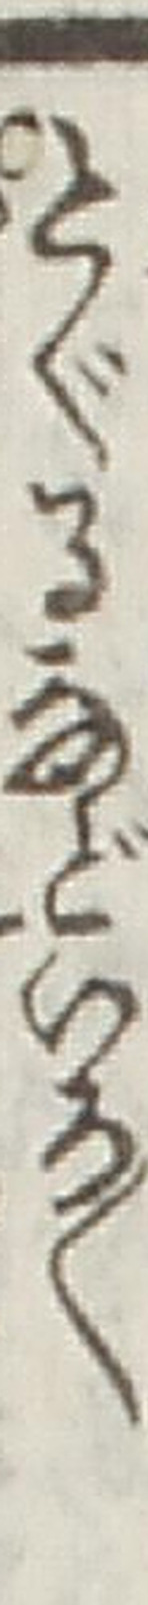とぐるなどいろ〳〵
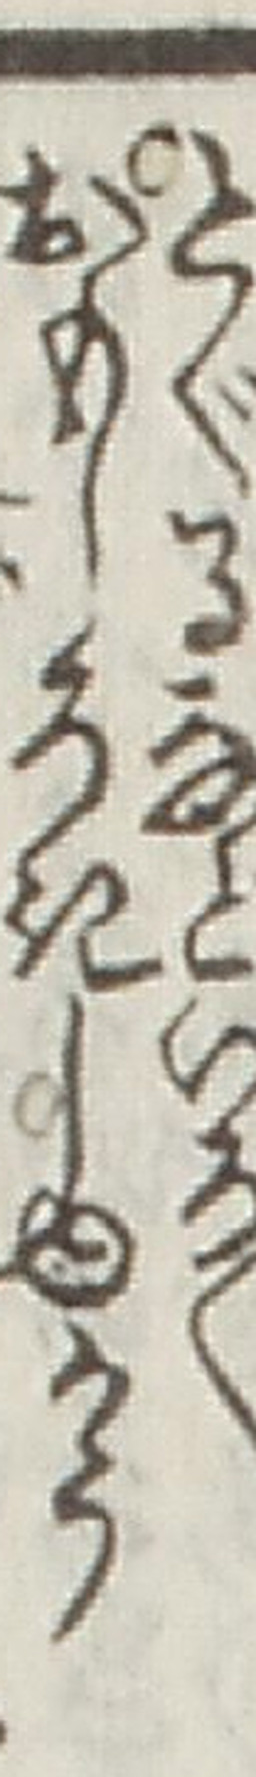おもしろきしゆかう
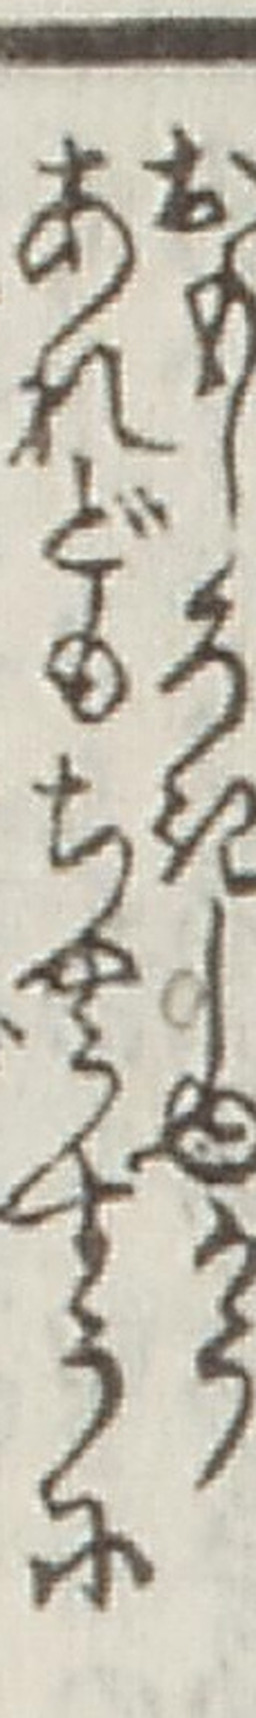あれどもちやうすうに
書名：三世相出雲當座帳　上下冊
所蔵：東京大学地震研究所図書室 Earthquake Research Institute Library, The University of Tokyo, JAPAN
